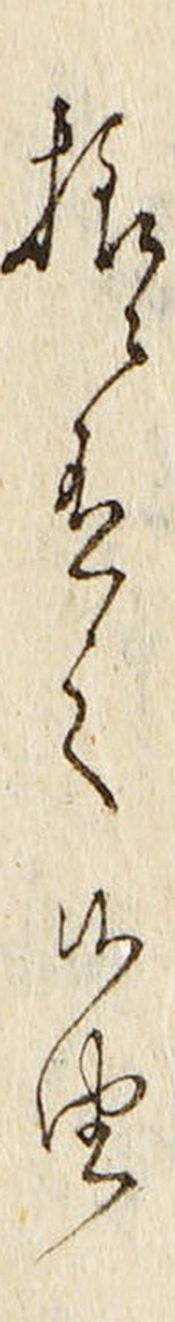様に有之候由
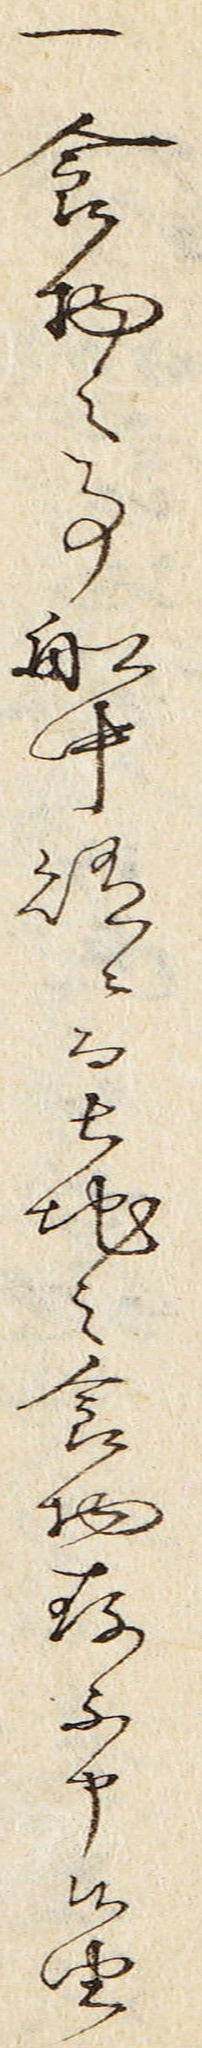一食物之事船中賄に而土地之食物存不申候由
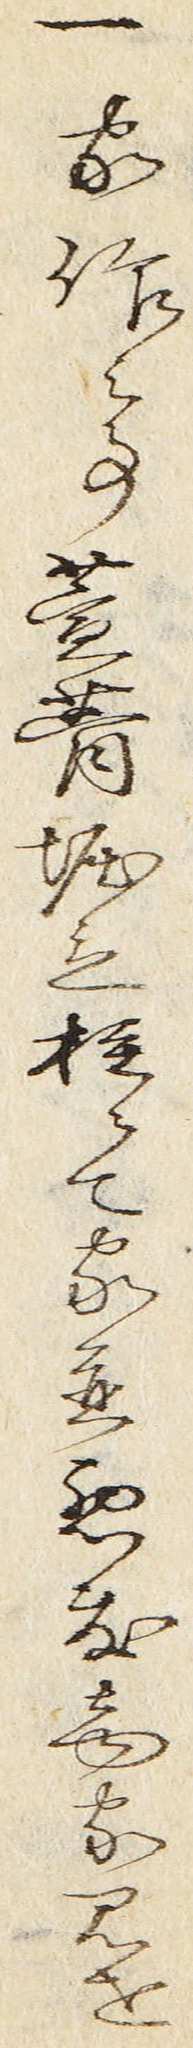一家作之事萱葺堀立柱にて家並悪敷商家見懸
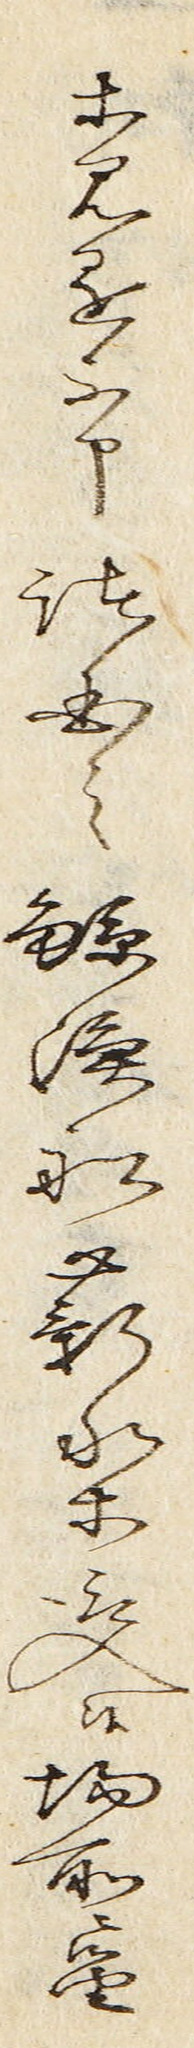等見懸不申諸国之鯨漁船薪水等取入候場所に候由
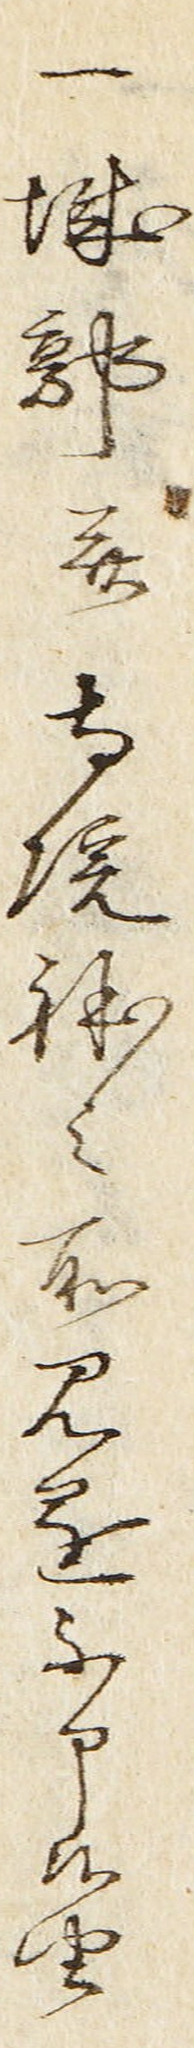一城郭并寺院躰之所見懸不申候由
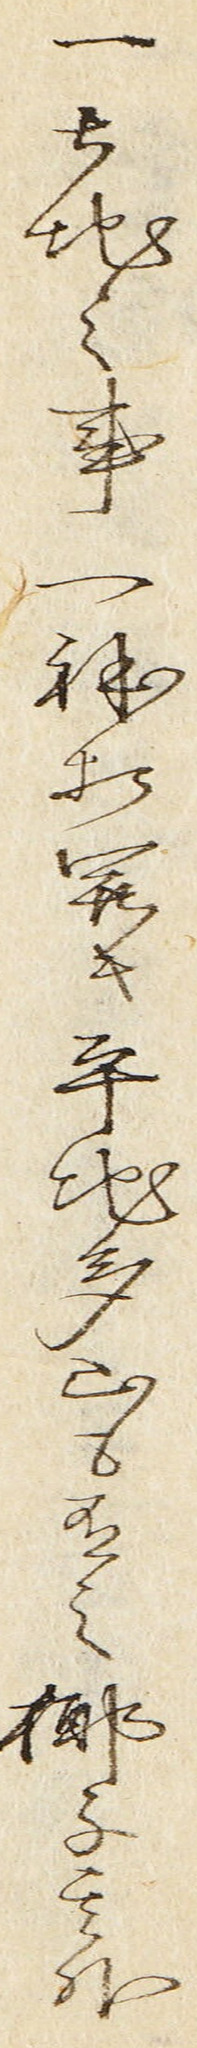一土地之事一躰相開き平地多山も有之椰子其外
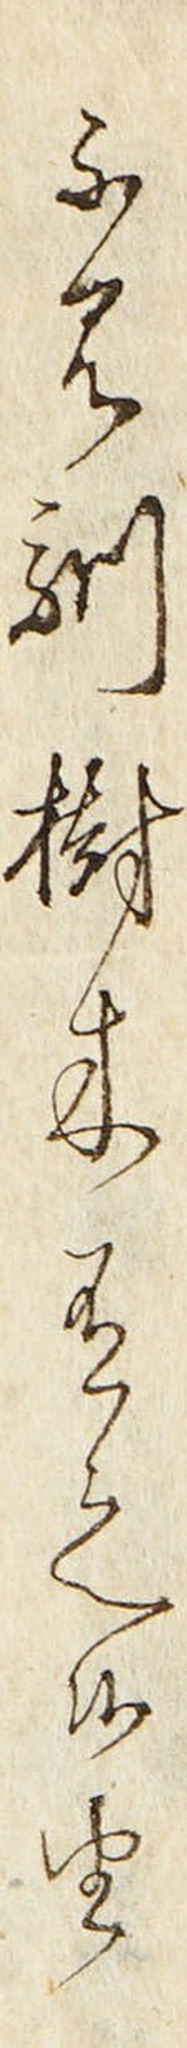不見馴樹木有之候由
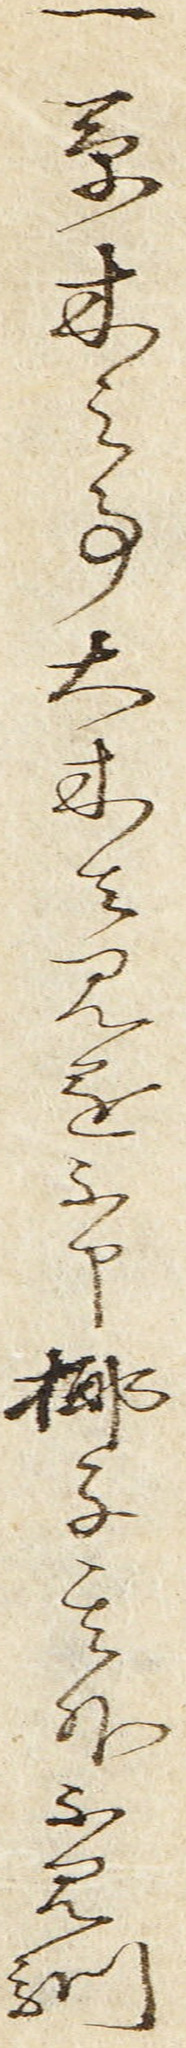一草木之事大木は見懸不申椰子其外不見馴
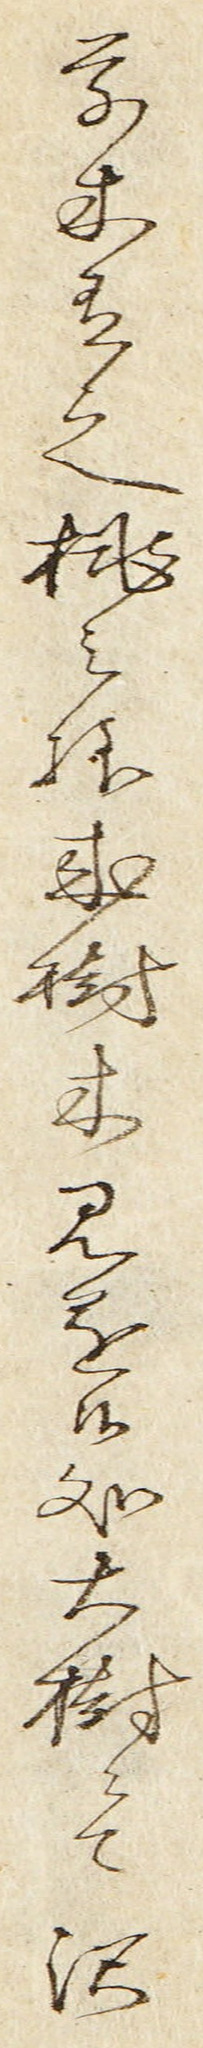草木有之桃之様成樹木見懸候処大樹にて沢

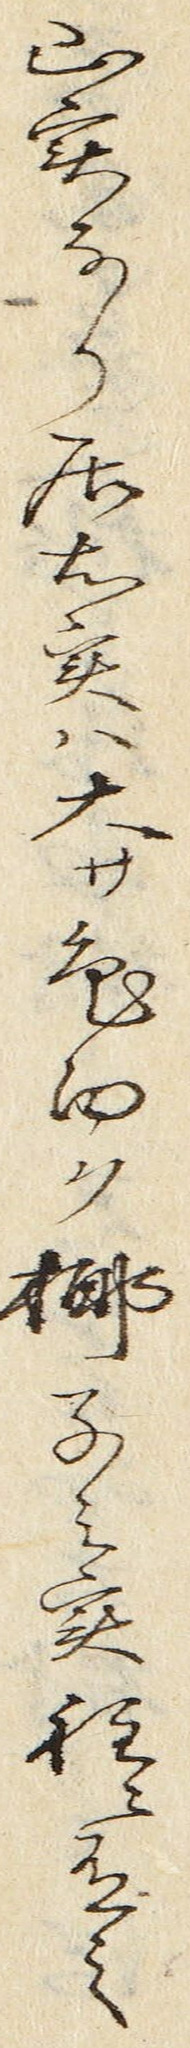山実なり居右実は大さ色白く椰子之実程に有之
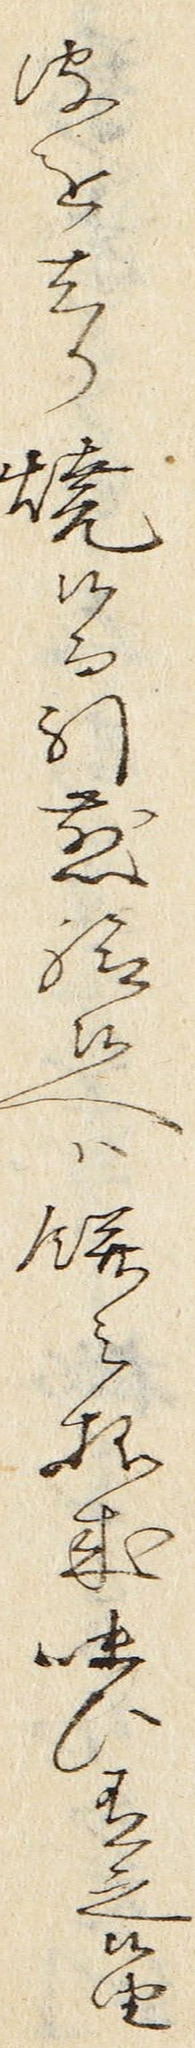皮を去り焼候而引蒸給候へは餅之様成味ひ有之候由
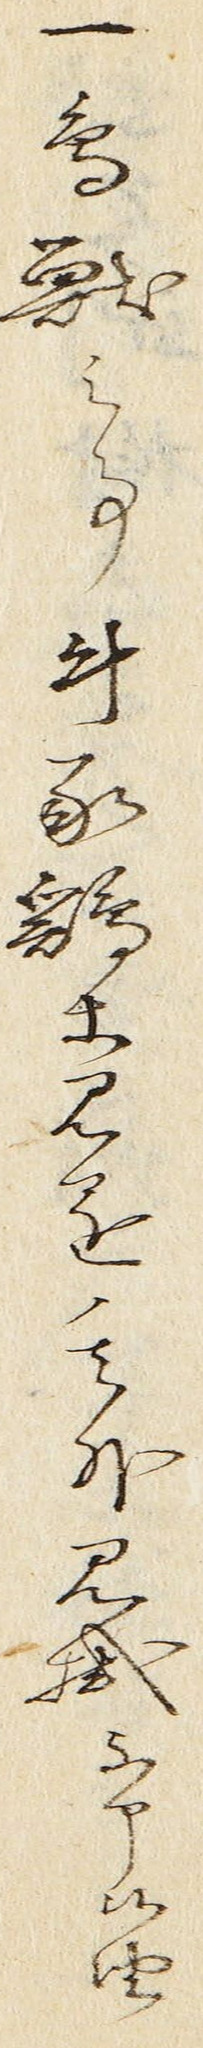一鳥獣之事牛豕鶏等見懸其外見掛不申候由
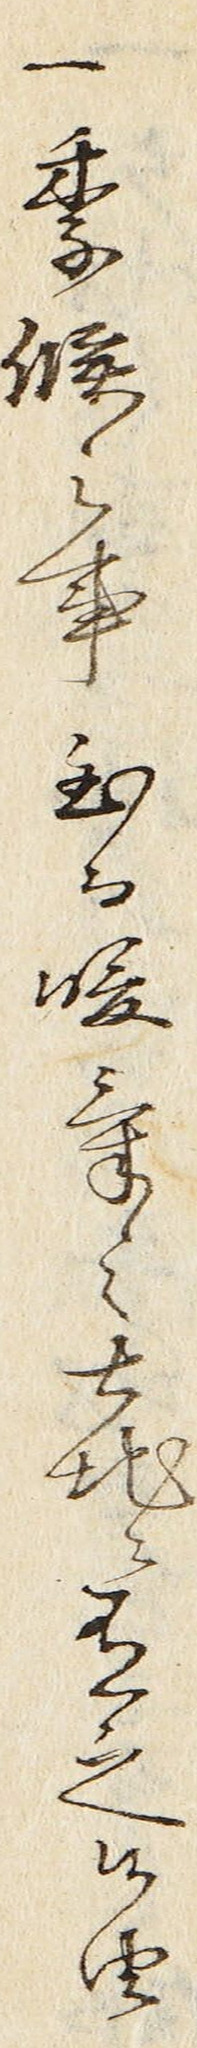一季候之事至而暖気之土地に有之候由
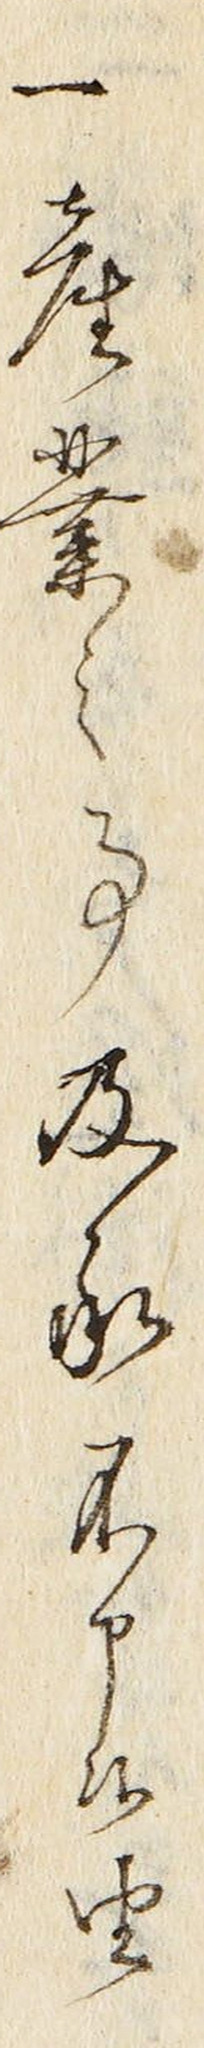一産業之事及承不申候由
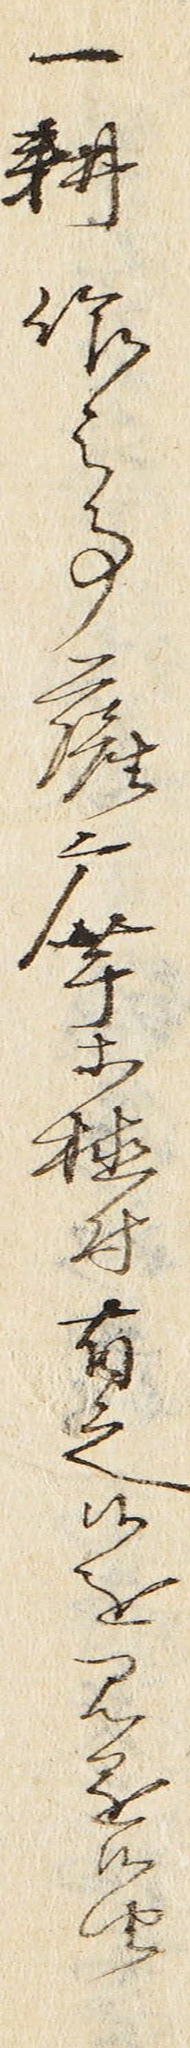一耕作之事薩摩芋等植付有之候を見懸候由
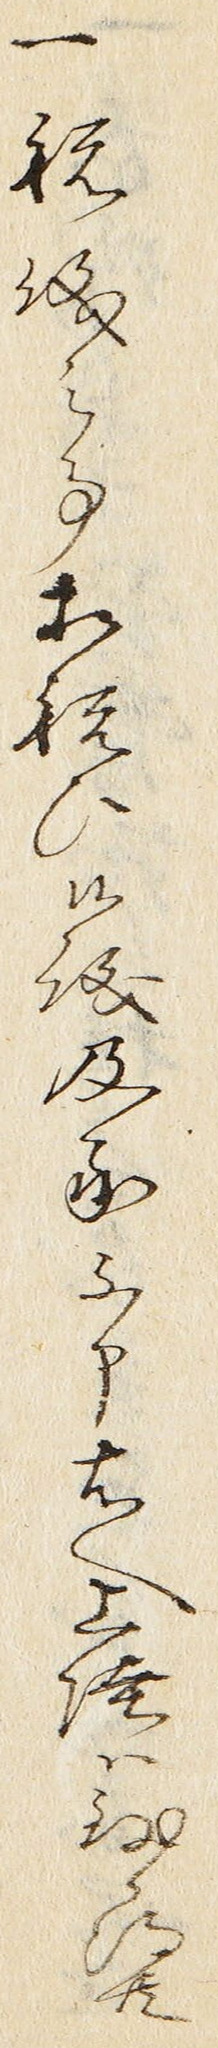一祝儀之事相祝ひ候儀及承不申右へ上陸は致候得共
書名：土佐中浜万次郎漂流記
